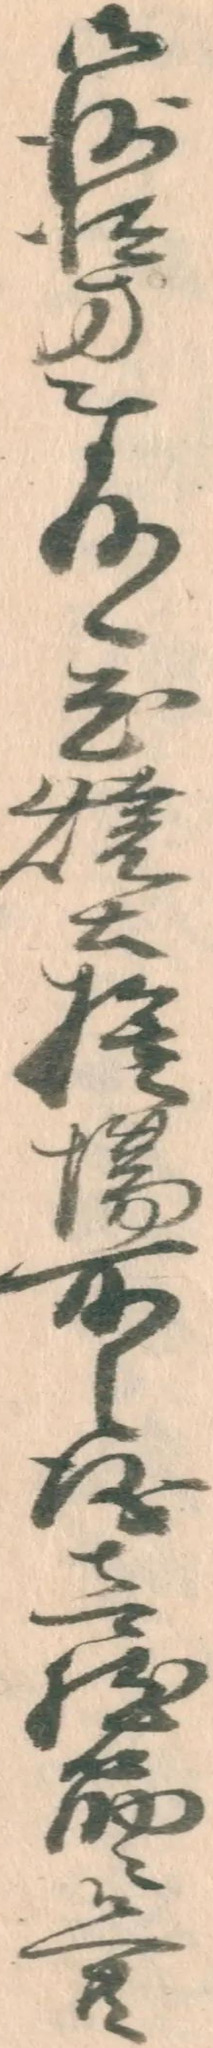御沙汰方奉存候尤焼土捨場所之儀は可然筋ニ候へ共
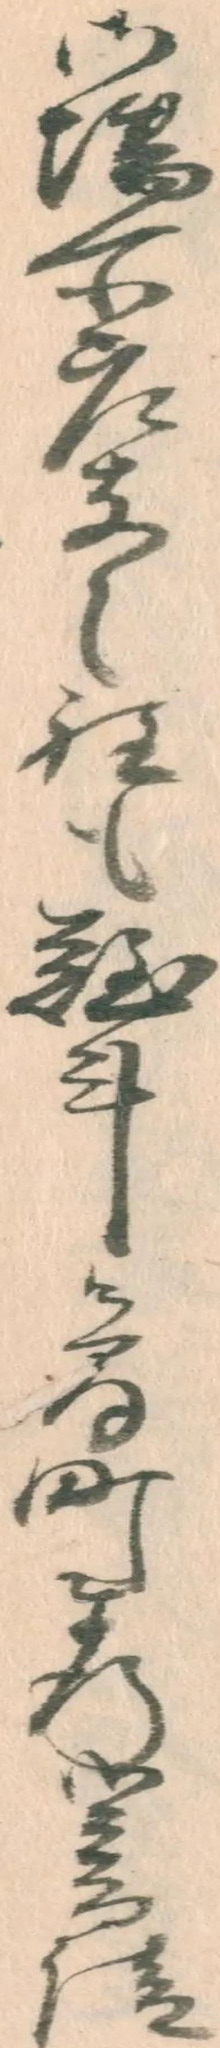御場所差支之程も難計候間町奉行御普請
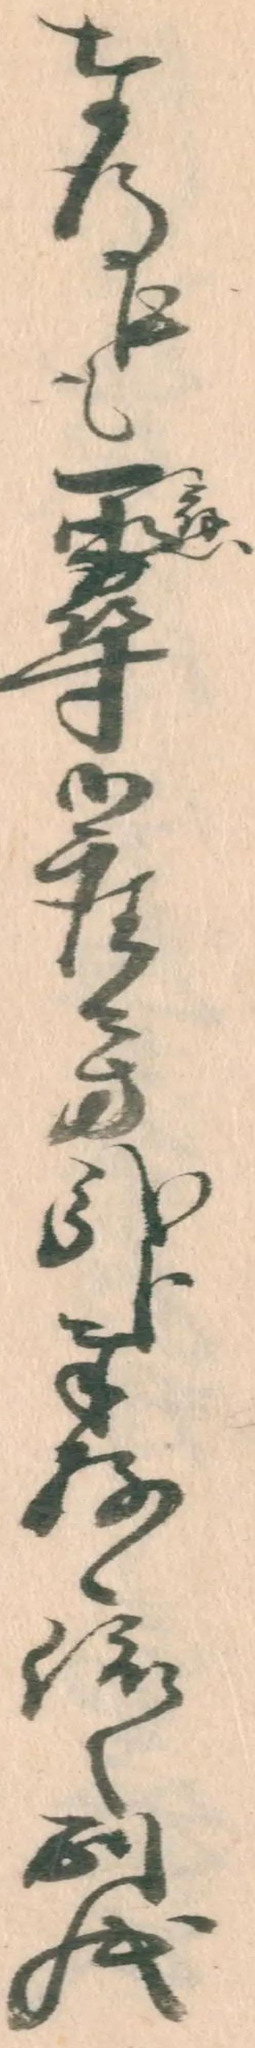奉行えも所ニ付尋御座候方哉ト奉存候依之別紙
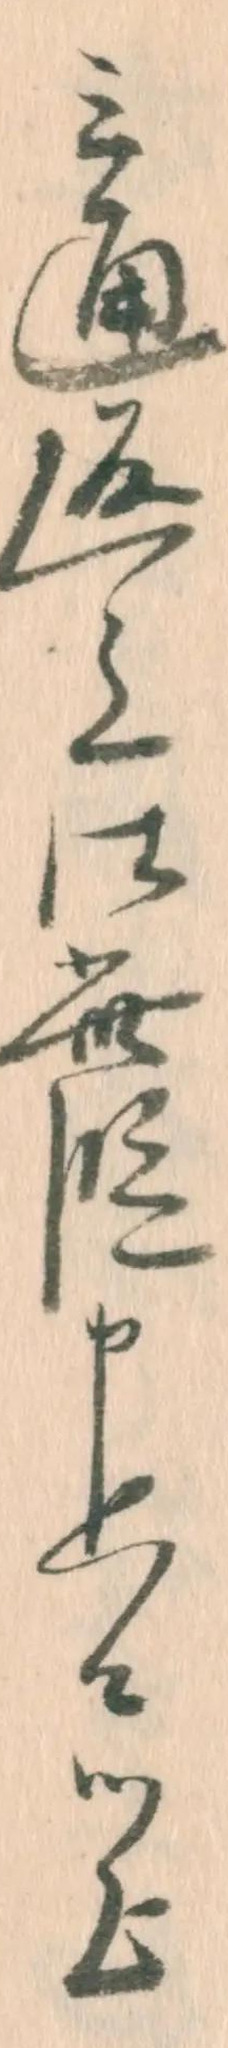之通返上仕此段申上候以上
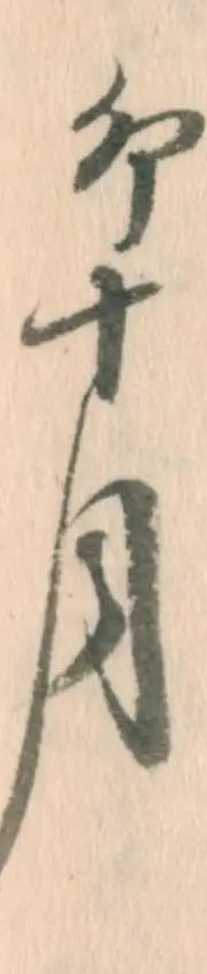卯十月
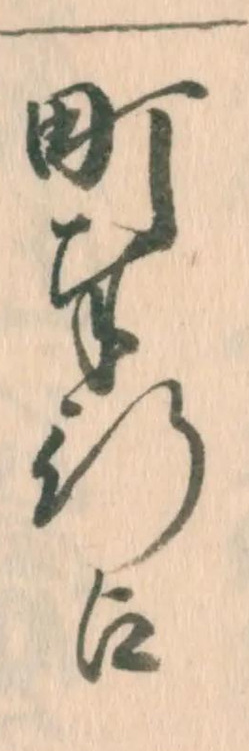│[町奉行え
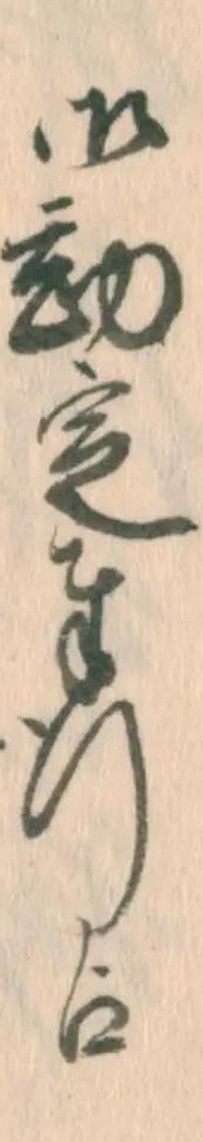御勘定奉行え
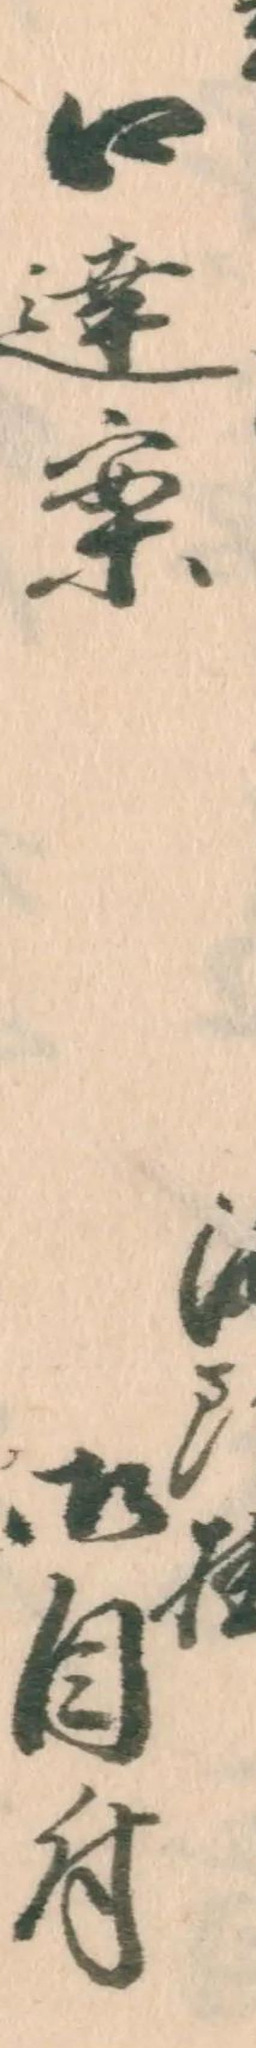│口達案御目付
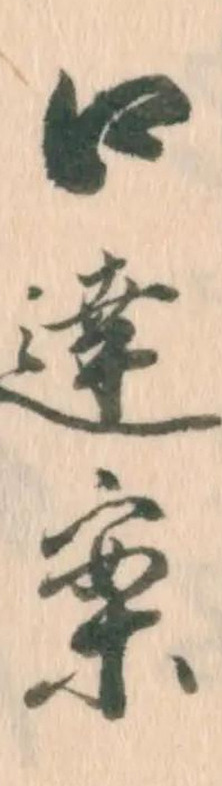御達案
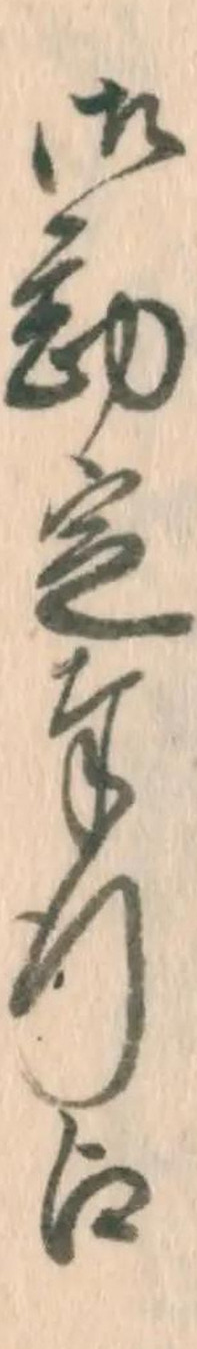御勘定奉行え
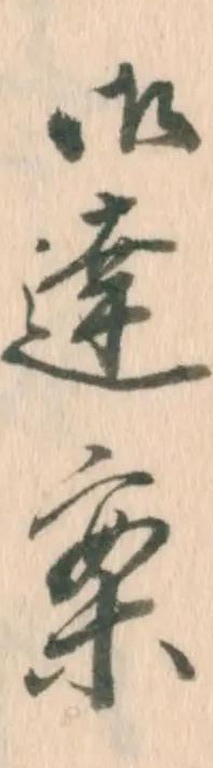御達案
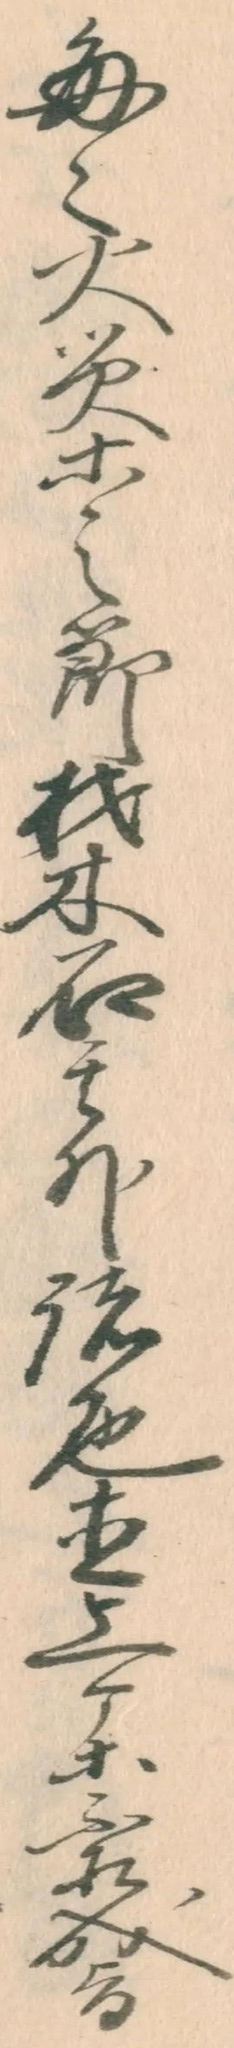毎〻火災等之節材木石其外諸色直上ケ等不相成旨
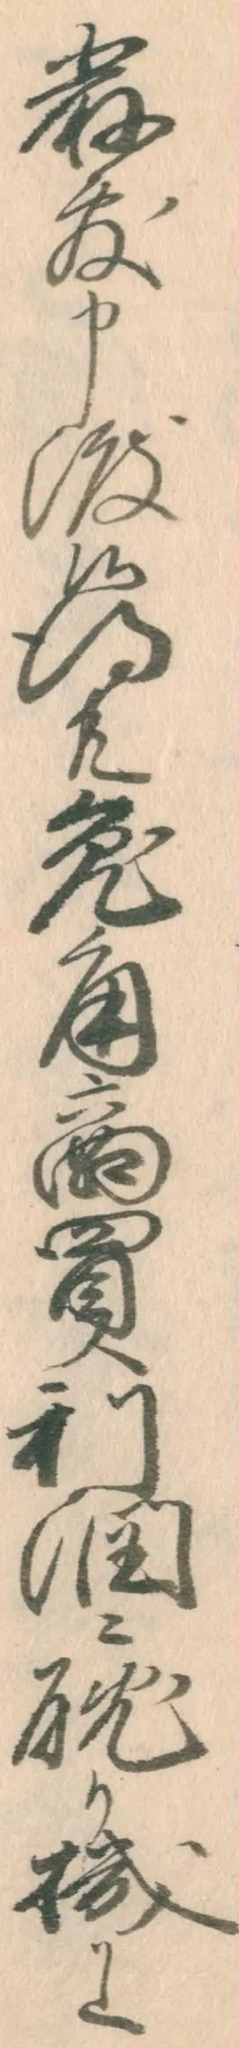厳敷申渡候得共兎角商買利潤ニ耽り機に

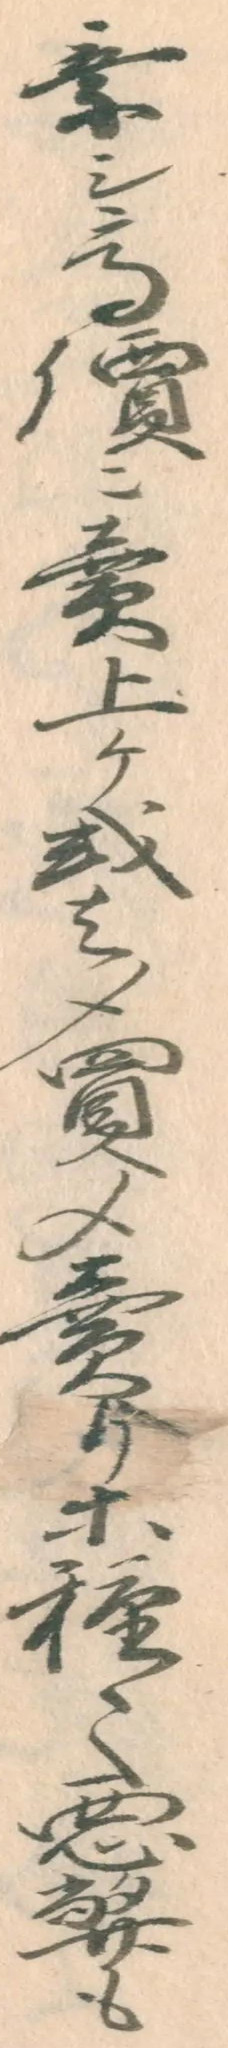乗シ高価ニ売上ケ或は〆買〆売り等種〻悪弊も
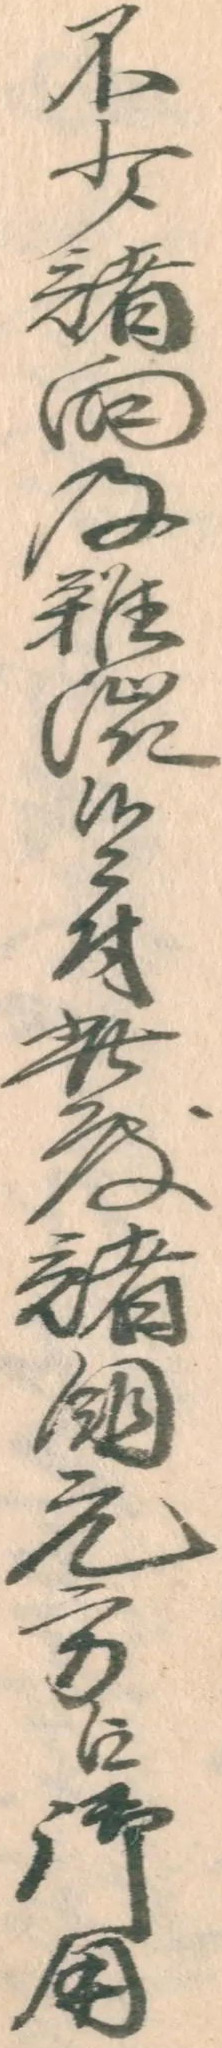不少諸向及難渋候ニ付此度諸国元方え御用
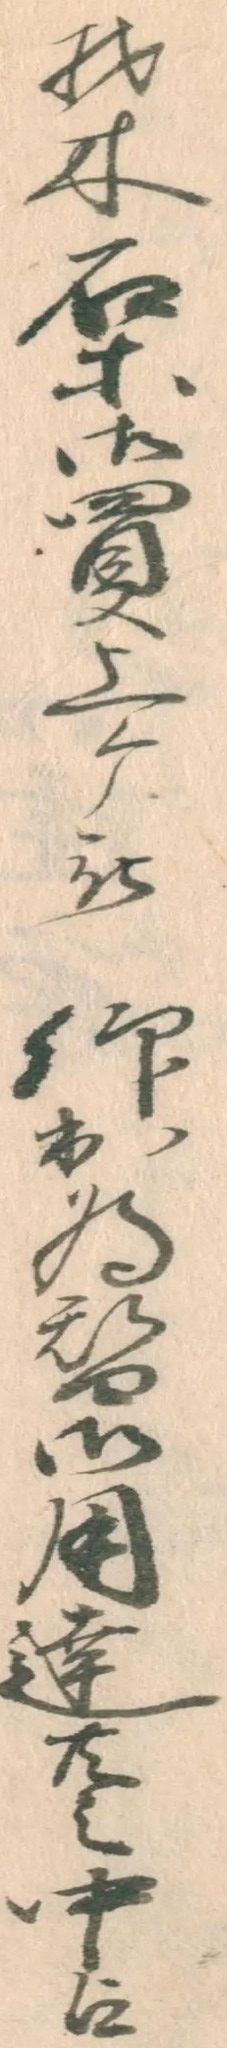材木石等御買上ケ被仰出為替御用達共之中え
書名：地震災書留 2巻. [2] 内表紙に「地震一件　安政二卯年十月」とあり
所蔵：国立国会図書館 National Diet Library, JAPAN
